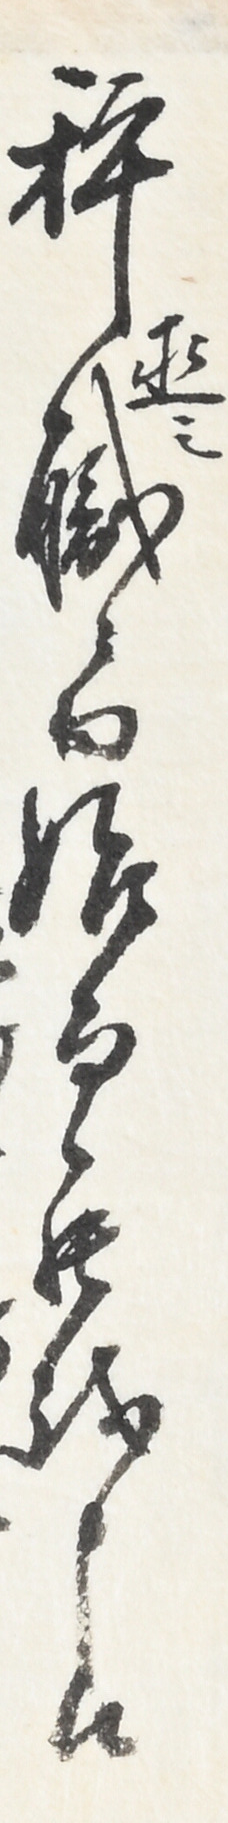秤職ニ而始而罷越申候
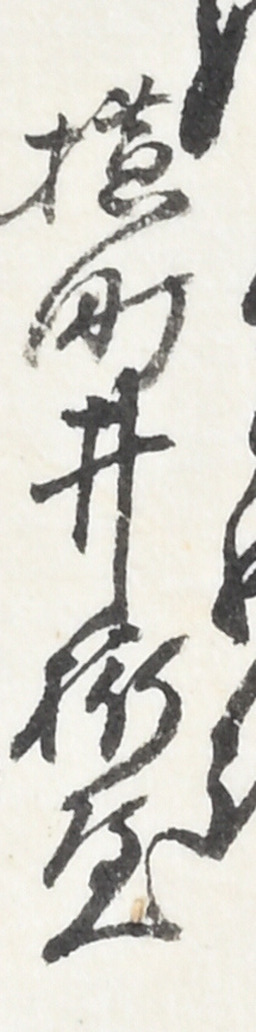横町井桁屋
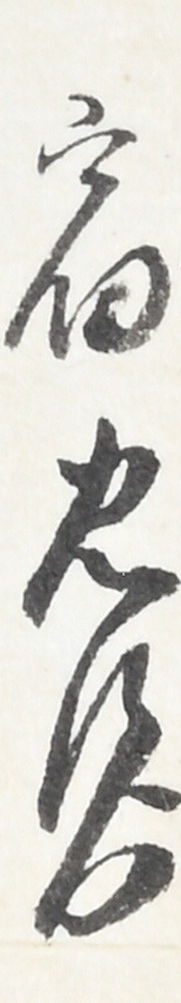宿忠左衛門
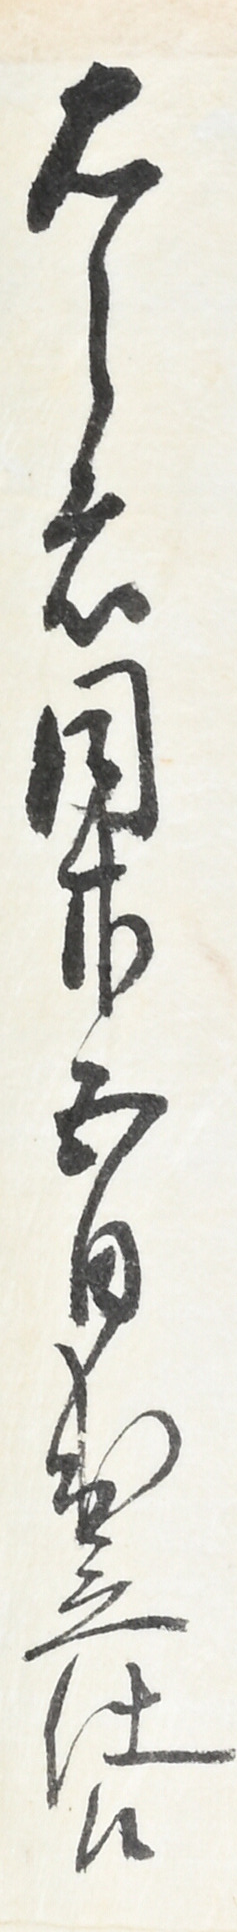右之者同廿五日出立仕候

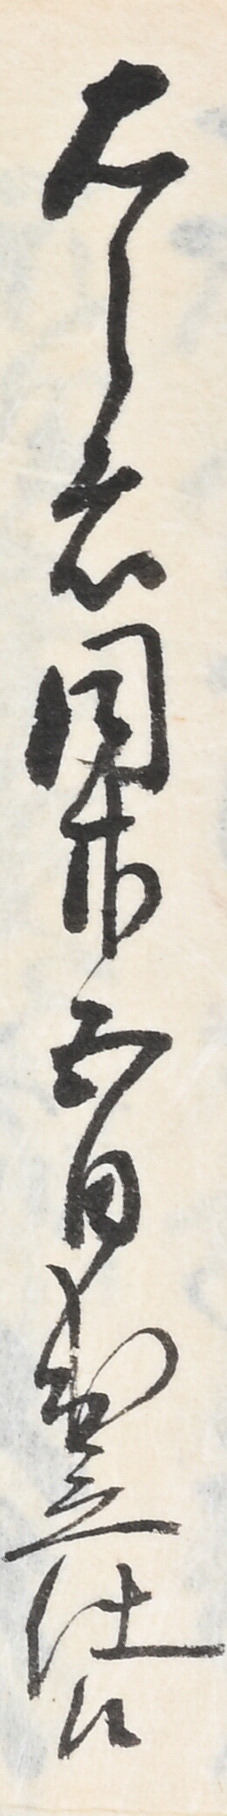右之者同十一日出立仕候
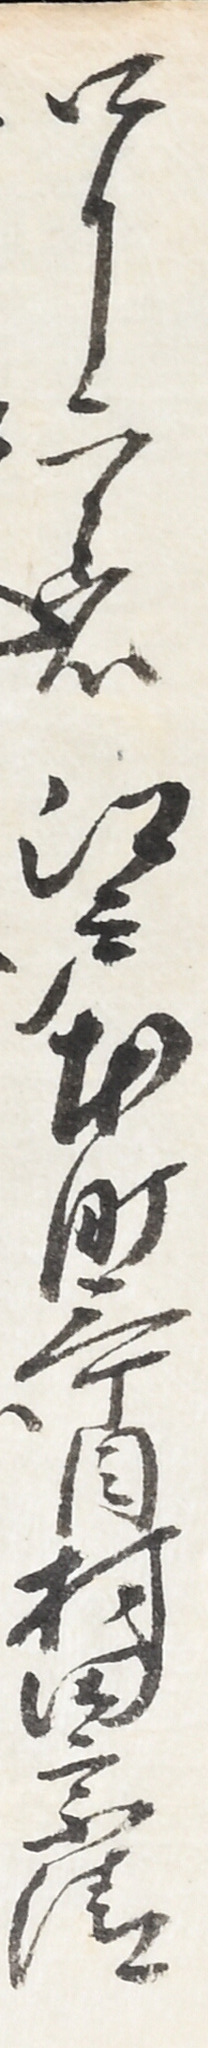四月二日着江戸本町三丁目村田宗清
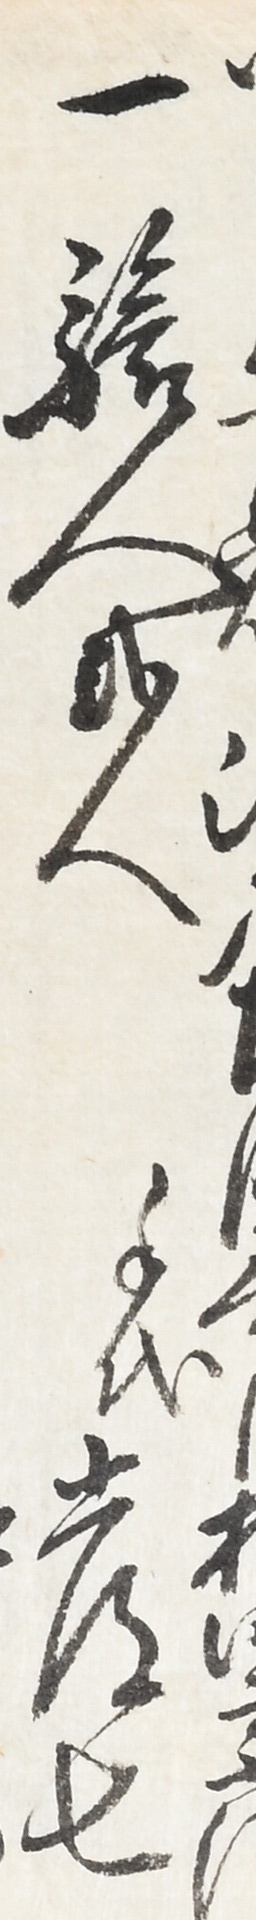一旅人弐人手代常七
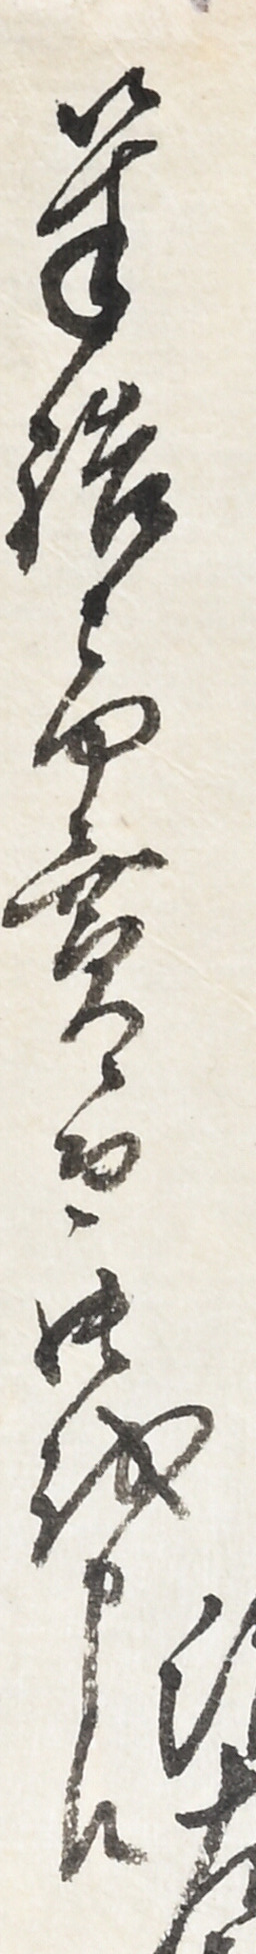筆結商売ニ而罷越申候
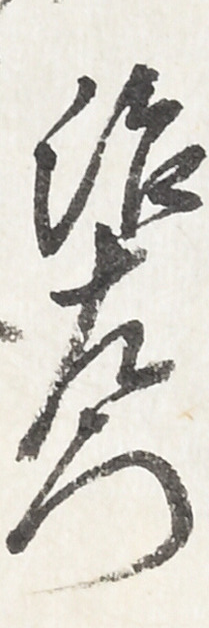治左衛門
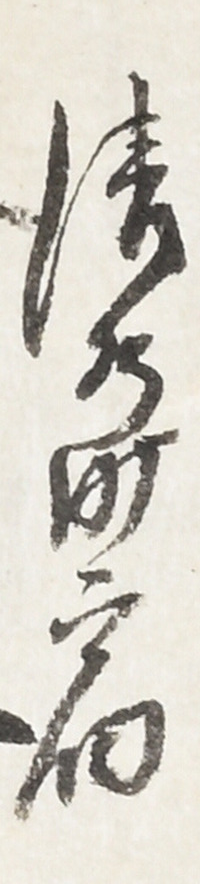清水町宿
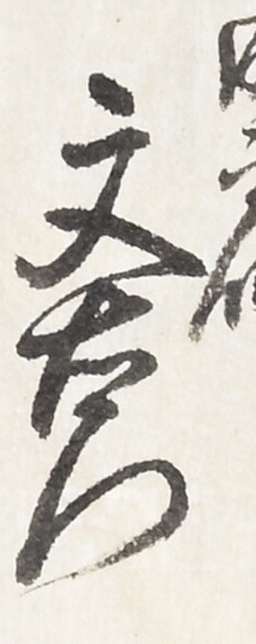文右衛門
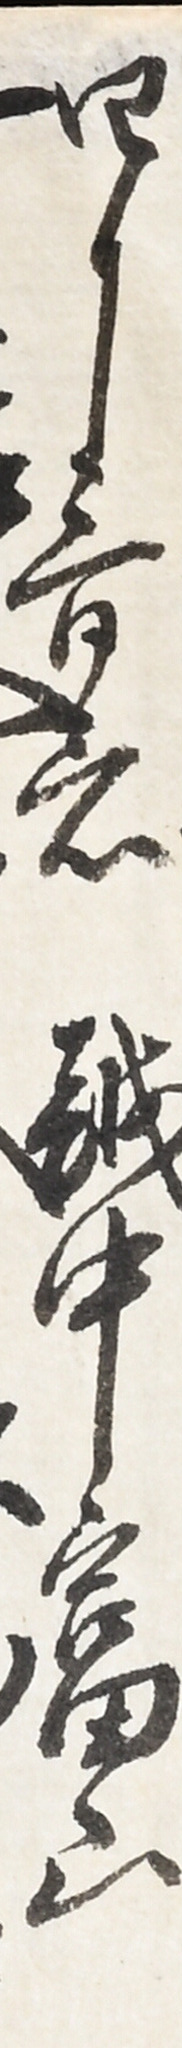四月三日着越中富山
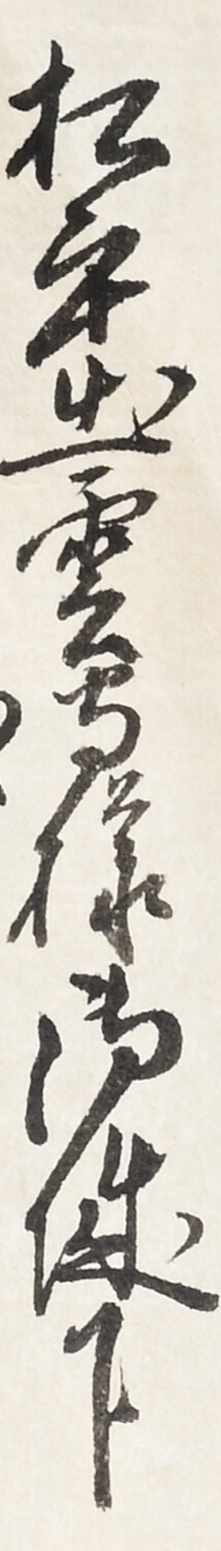松平出雲守様御城下
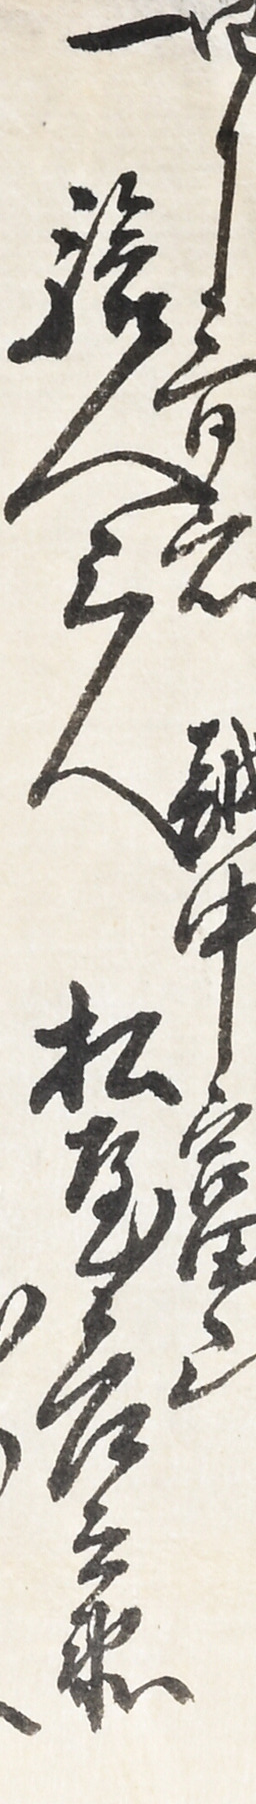一旅人三人松屋吉兵衛
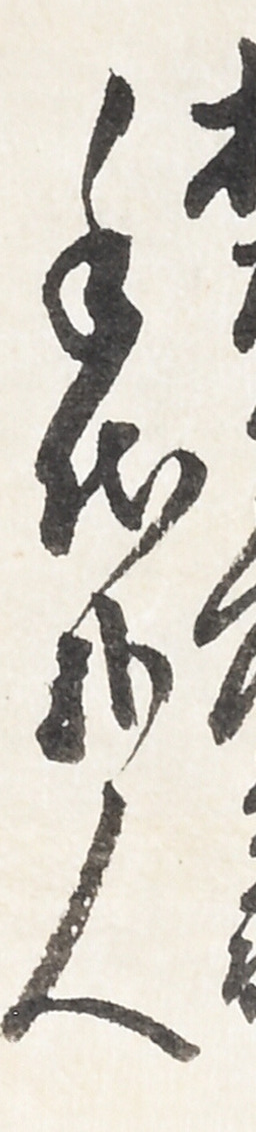手代弐人
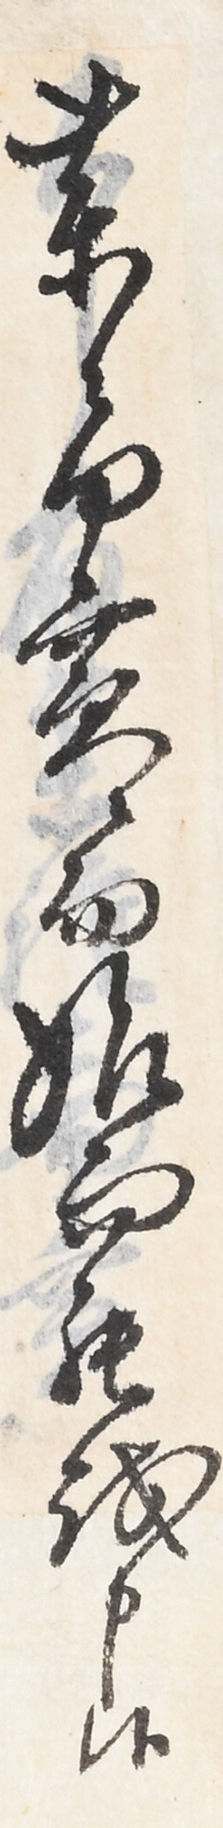薬商売ニ而始而罷越申候
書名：旅人泊控帳
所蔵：伊那市立高遠町図書館・合同会社AMANE
